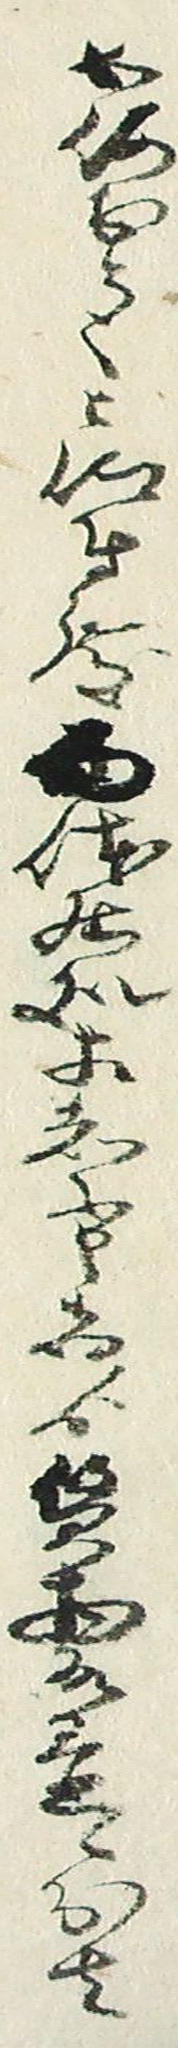如何分とも被仰付度面体居処相知不申者ゟ質物取置候分者
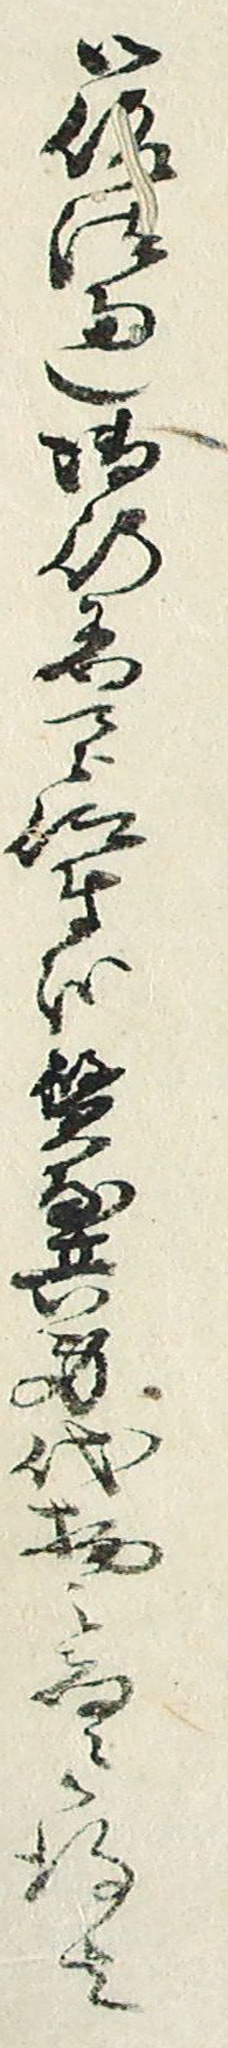御作法通御行着可被仰付哉質屋共身代柄之者ニ候得者

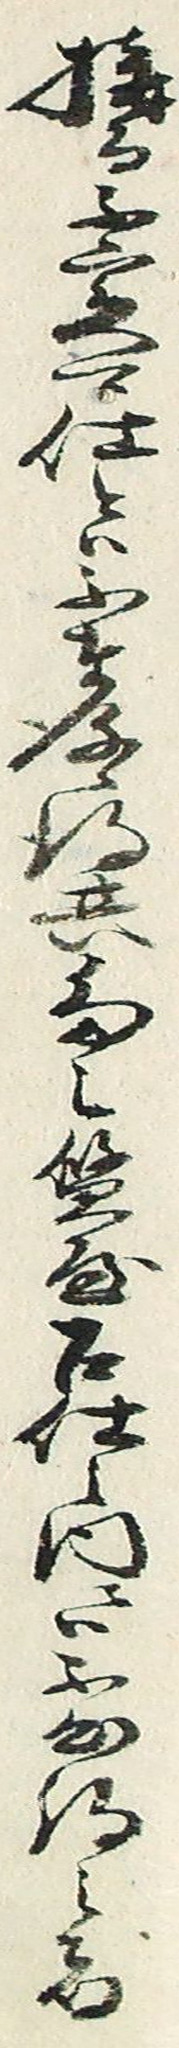構而不実可仕とハ不奉存候得共多之質屋召仕之内ニハ不心得之者
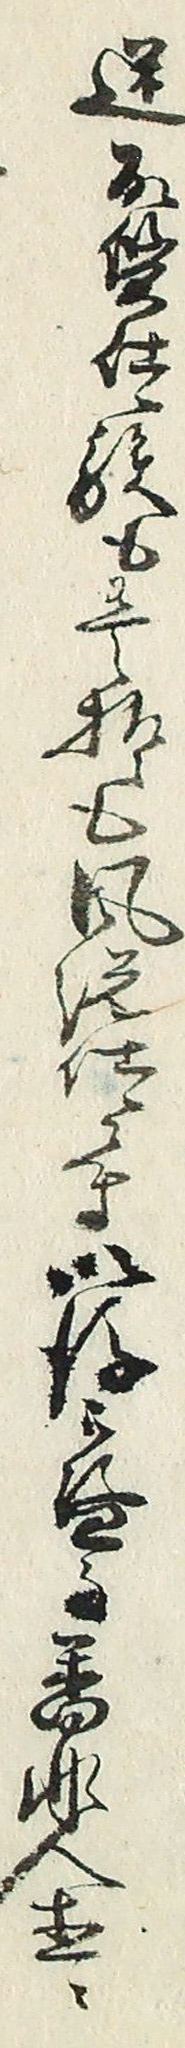迷取質仕候族も有之様ニも風説仕候ニ付以後被盗主番非人直ニ
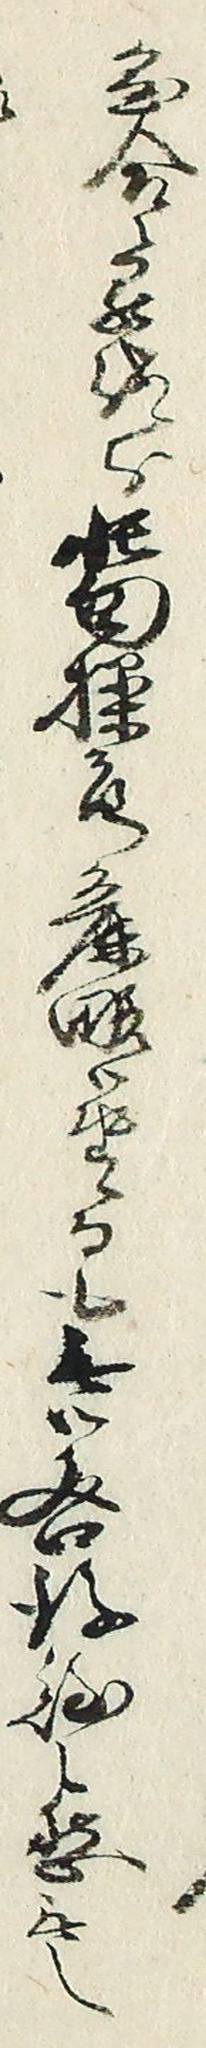懸合ニ罷越候分帳面操落麁略御坐候而も無御咎後難之恐無之
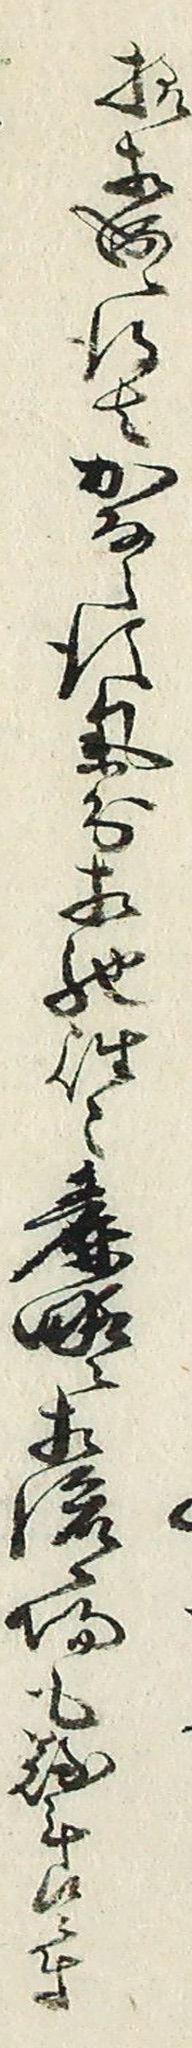様相成候得者かならす氣分相弛往々麁略ニ相流候場も難計候ニ付
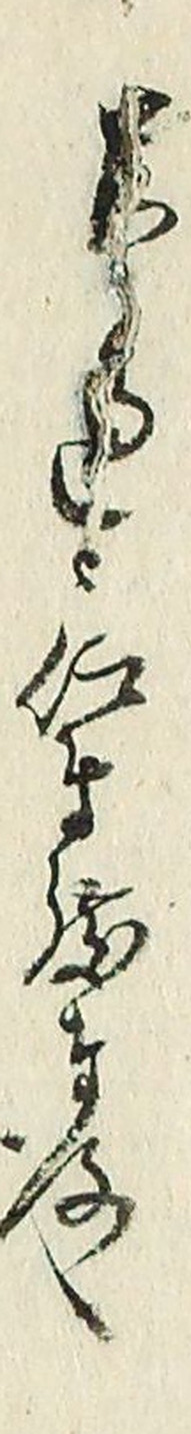右之通被仰付度奉存候
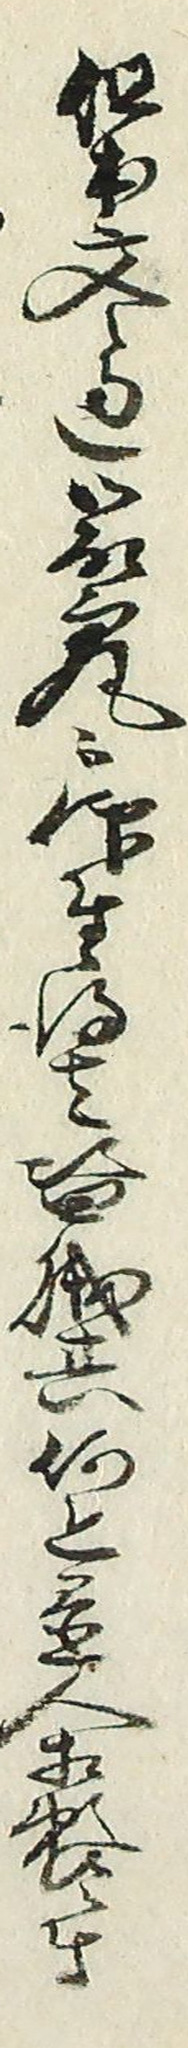但本文之通御取究被仰付候得者盗賊共何れ置人相頼候ニ付
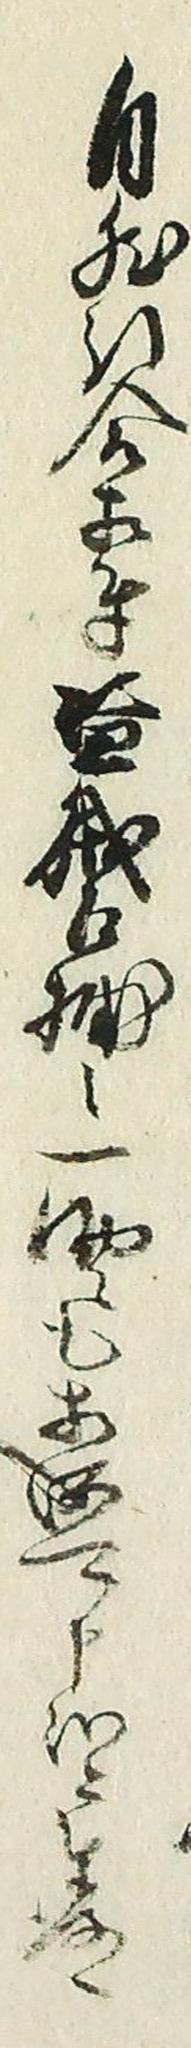自然引合相付盗賊召捕之一助ニも相成可申哉ニ奉存候
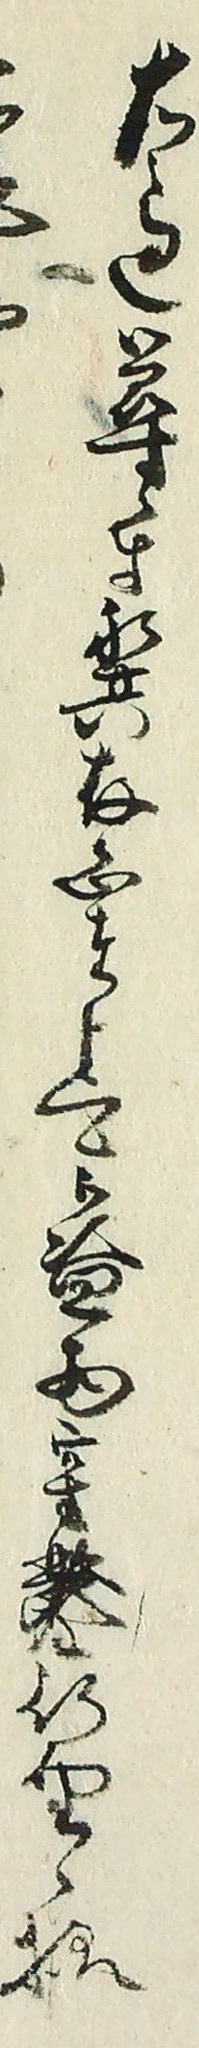右之通御尋ニ付私共存念奉申上候被盗物穿鑿行届候様
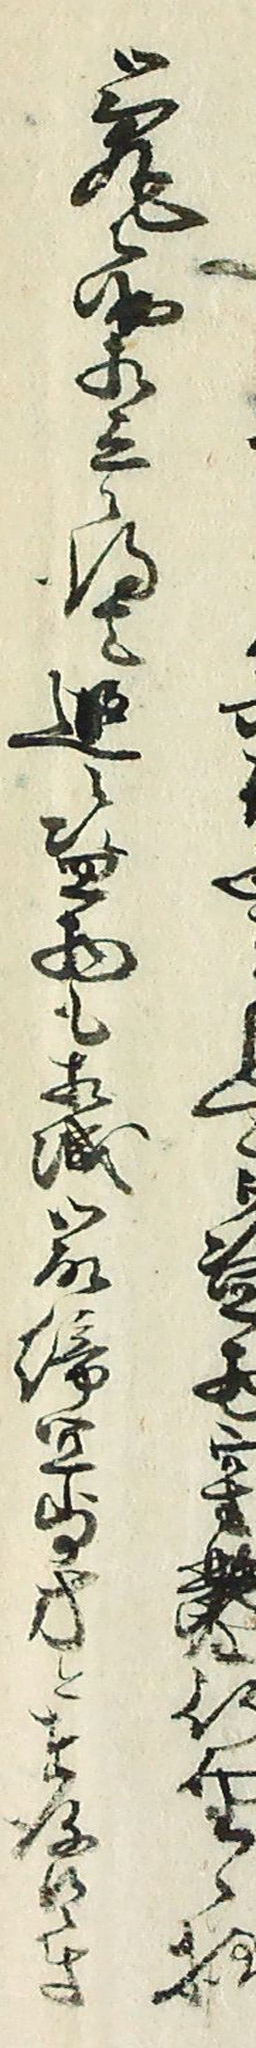御究之助相立候得者追々盗物も相減御取締宜布方と奉存候ニ付
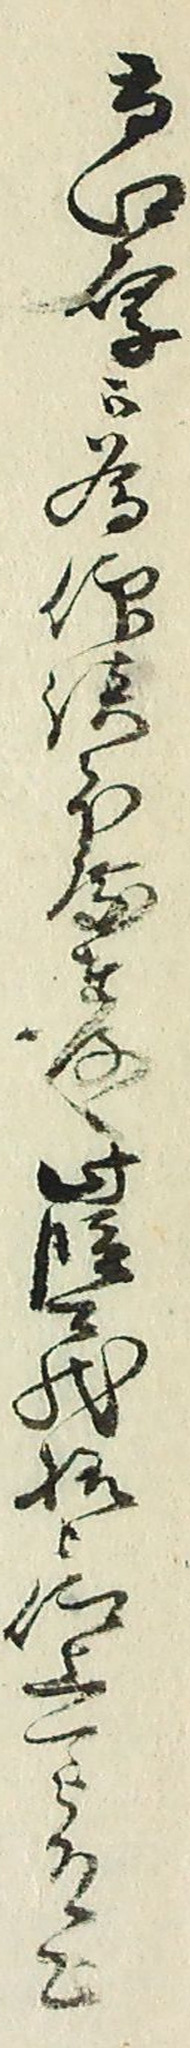市郷厚被為仰談被下度奉存候此段可然様被仰上可被下候以上
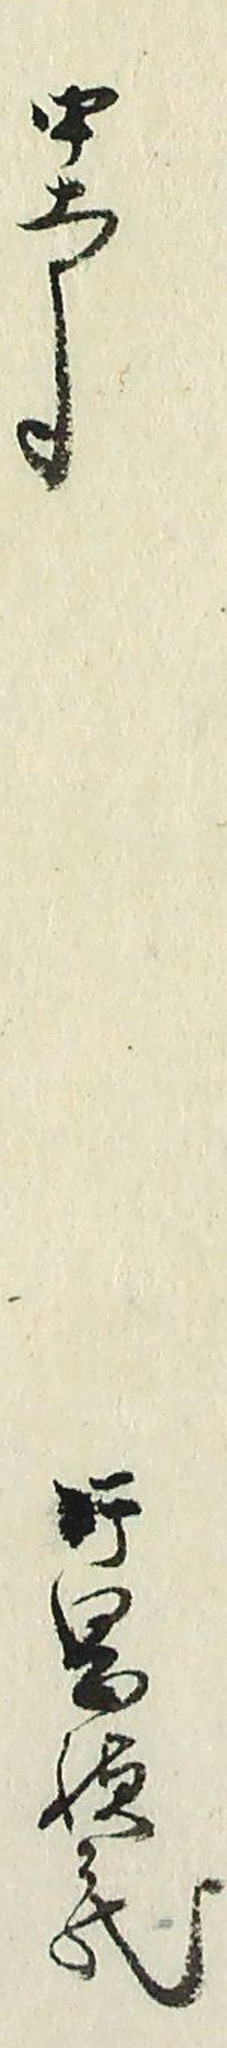申十一月片岡續蔵
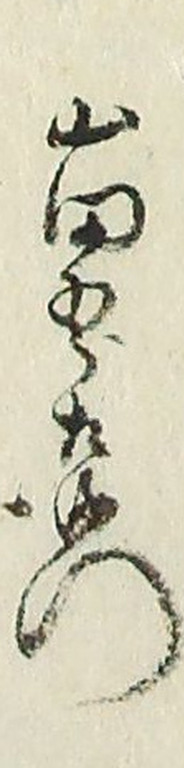山田五郎左衛門
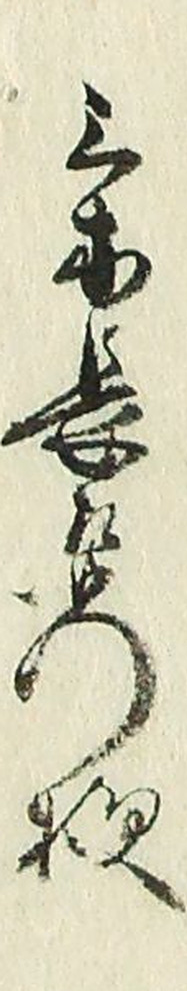三木長左衛門様
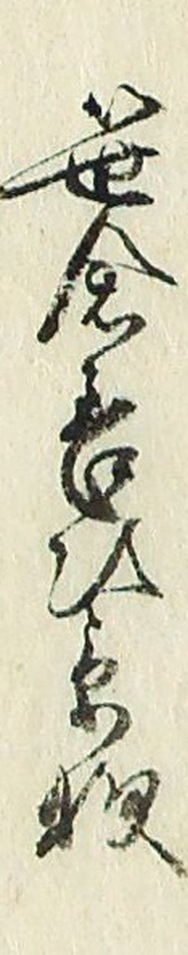笹倉善次兵衛様
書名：市郷質屋株御取究並御書出御趣法之写
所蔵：鳴門教育大学 Naruto University of Education
